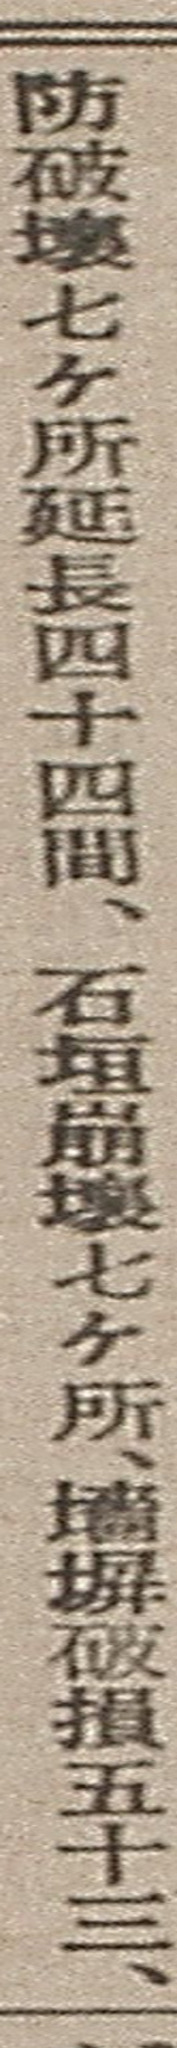防破壊七ケ所延長四十四間、石垣崩壊七ケ所、墻塀破損五十三、
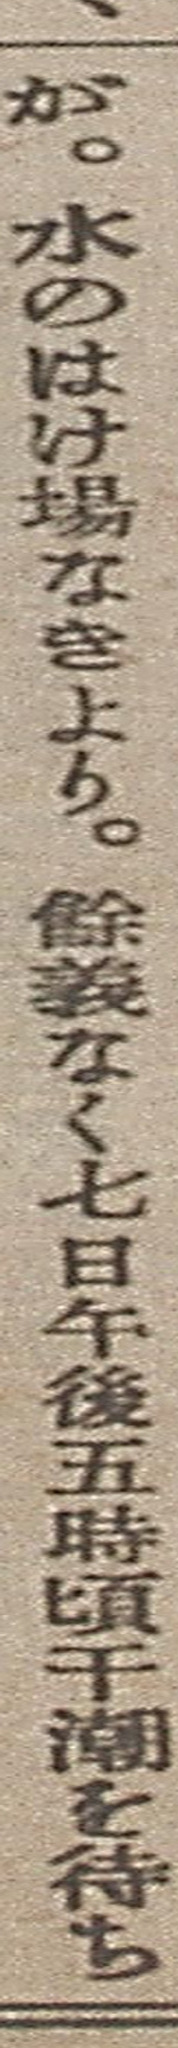が。水のはけ場なきより。余義なく七日午後五時頃干潮を待ち
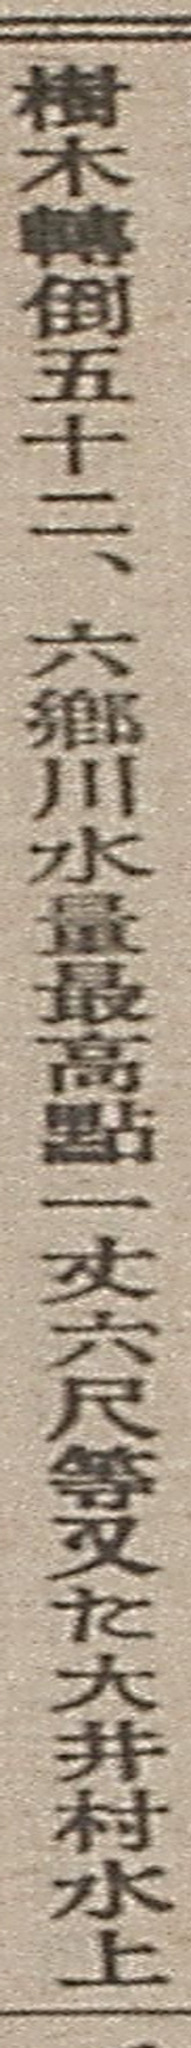樹木転倒五十二、六郷川水量最高点一丈六尺等又た大井村水上
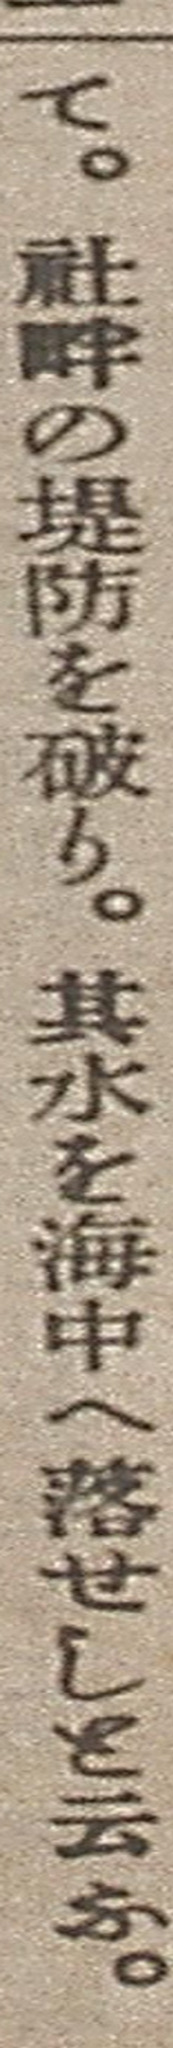て。社畔の堤防を破り。其水を海中へ落せしと云ふ。
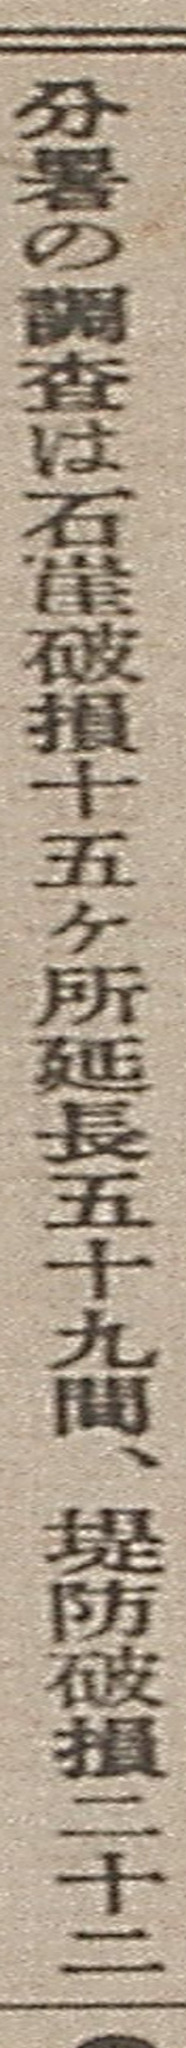分署の調査は石崖破損十五ケ所延長五十九間、堤防破損二十二
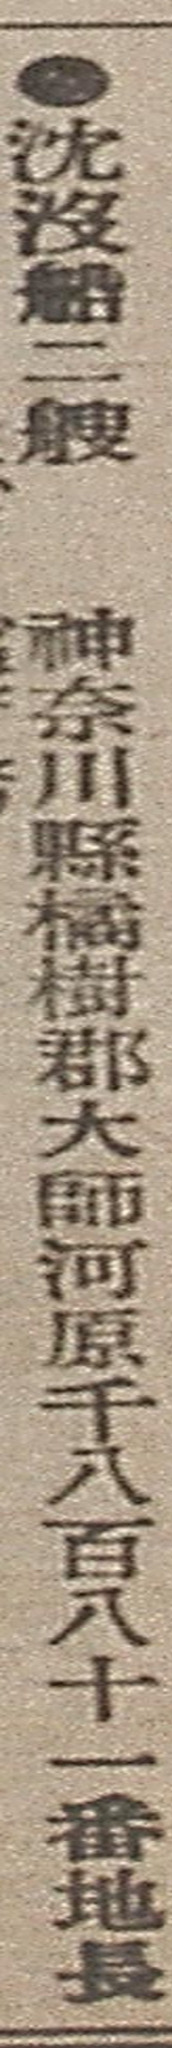●沈没船二艘神奈川県橘樹郡大師河原千八百八十一番地長
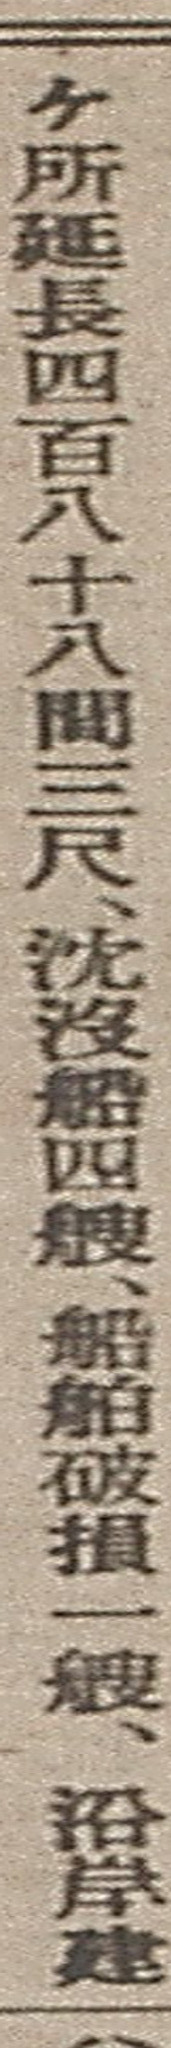ケ所延長四百八十八間三尺、沈没船四艘、船舶破損一艘、沿岸建
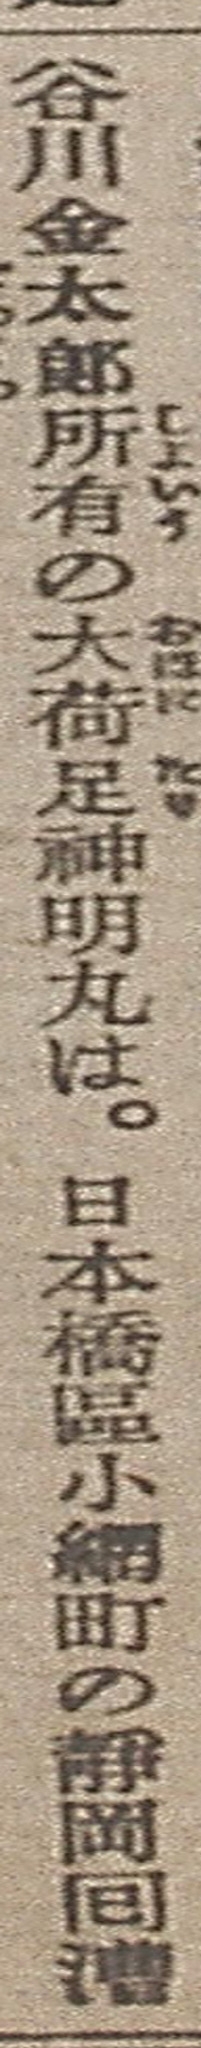谷川金太郎所有の大荷足神明丸は。日本橋区小網町の静岡回漕
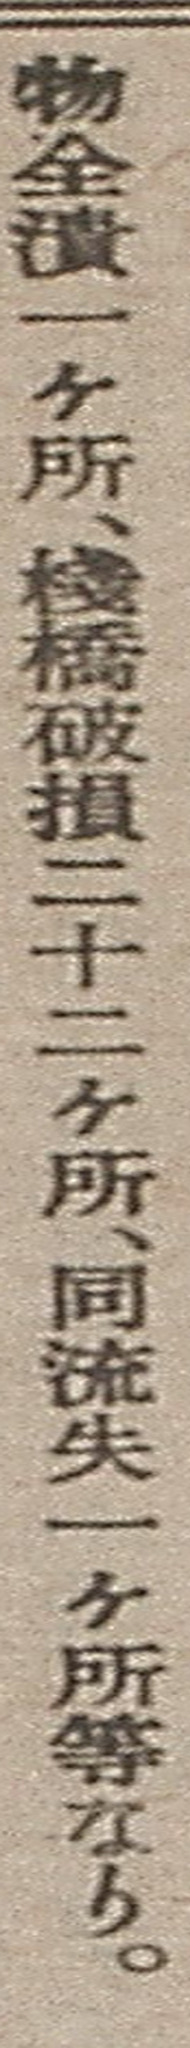物全潰一ケ所、桟橋破損二十二ケ所、同流失一ケ所等なり。
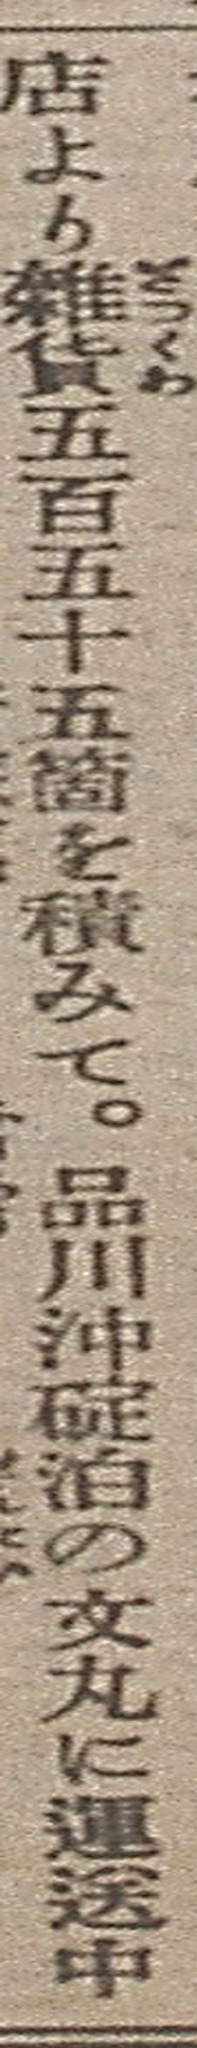店より雑貨五百五十五個を積みて。品川沖碇泊の文丸に運送中
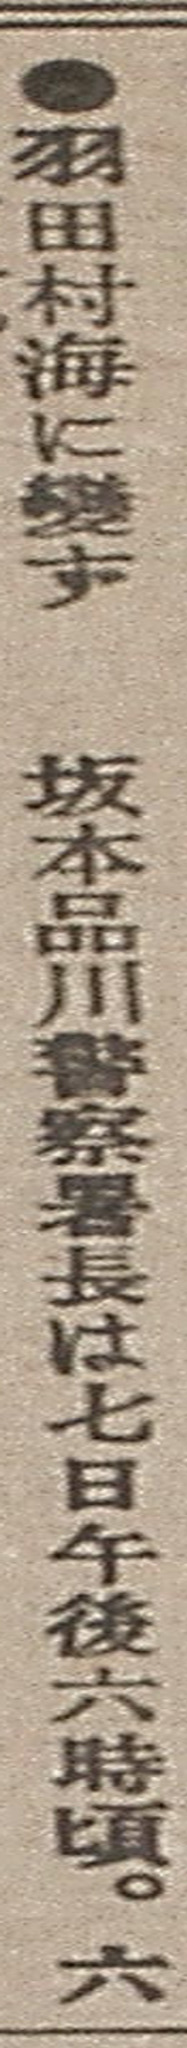●羽田村海に変ず坂本品川警察署長は七日午後六時頃。六
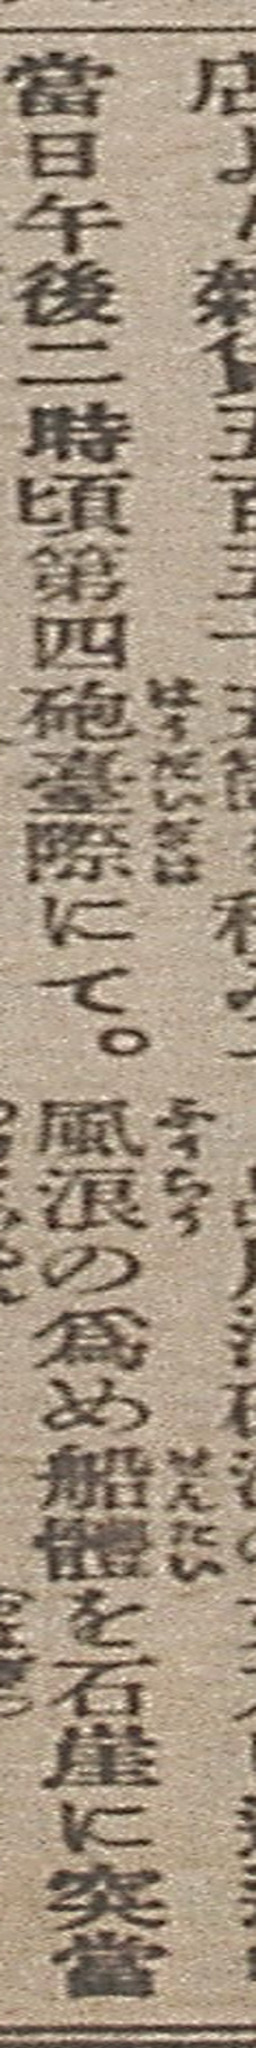当日午後二時頃第四砲台際にて。風浪の為め船体を石崖に突当
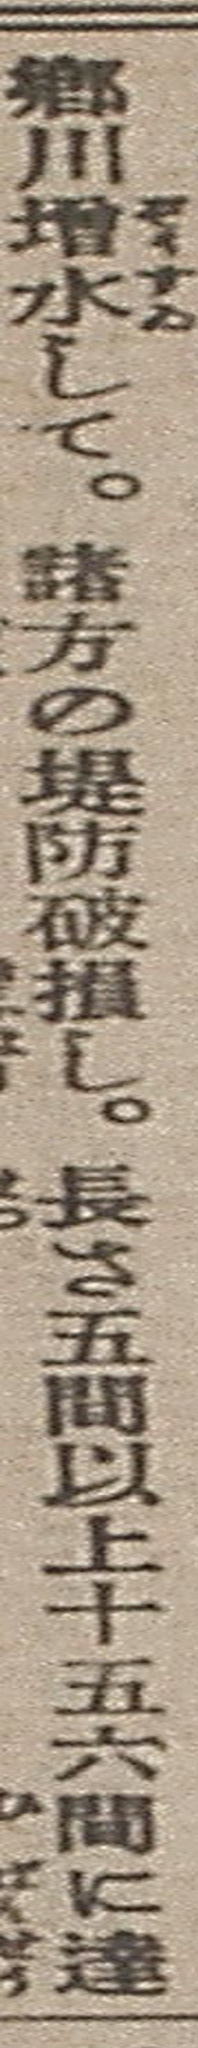郷川増水して。諸方の堤防破損し。長さ五間以上十五六間に達
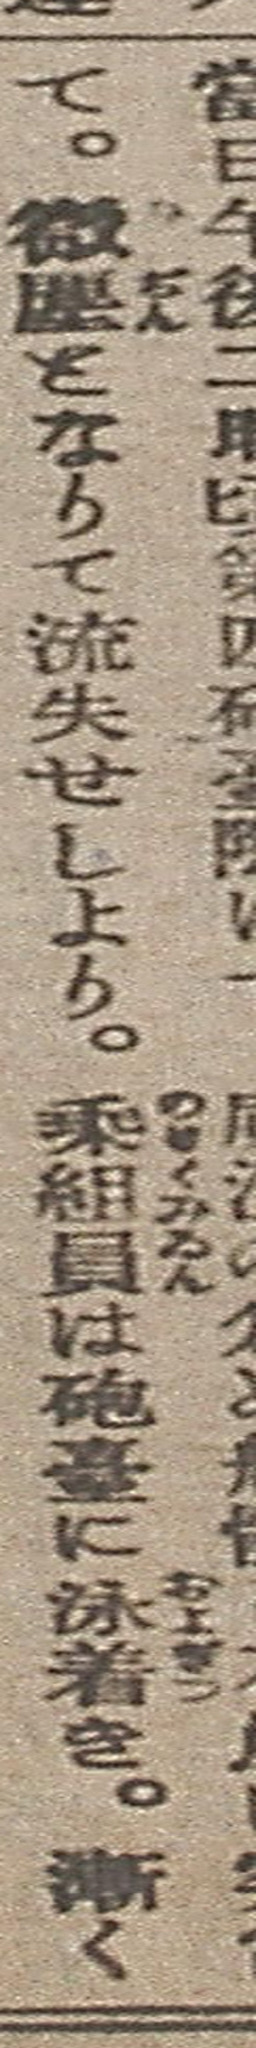て。微塵となりて流失せしより。乗組員は砲台に泳着き。漸く
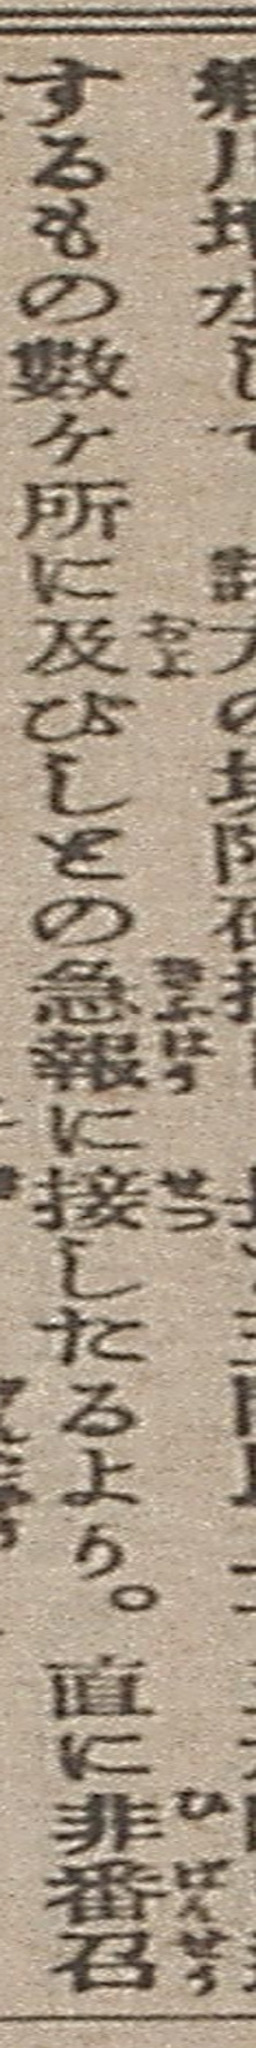するもの数ケ所に及びしとの急報に接したるより。直に非番召
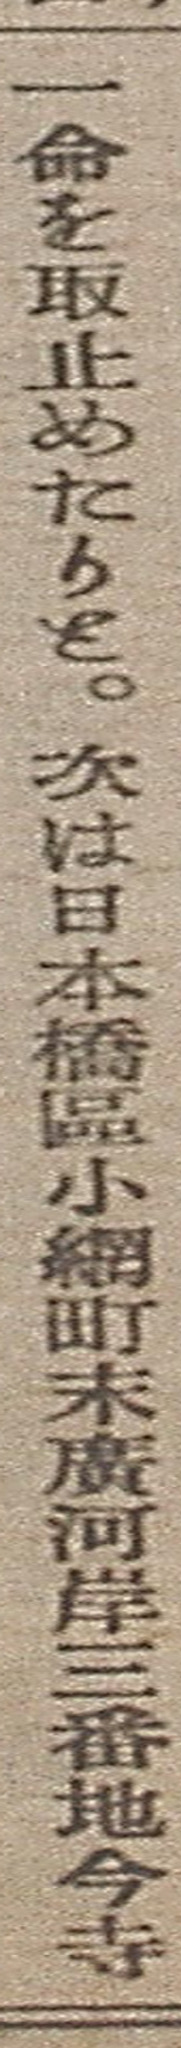一命を取止めたりと。次は日本橋区小網町末廣河岸三番地今寺
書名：風俗畫報臨時増刊第百九十九號　明治三十二年十月各地災害圖會（前編之續）
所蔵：東京大学地震研究所図書室 Earthquake Research Institute Library, The University of Tokyo, JAPAN
